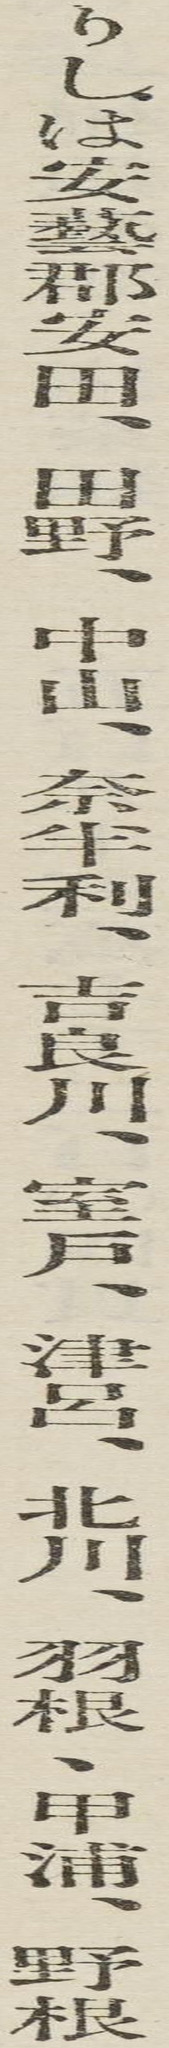りしは安芸郡安田、田野、中山、奈半利、吉良川、室戸、津呂、北川、羽根、甲浦、野根
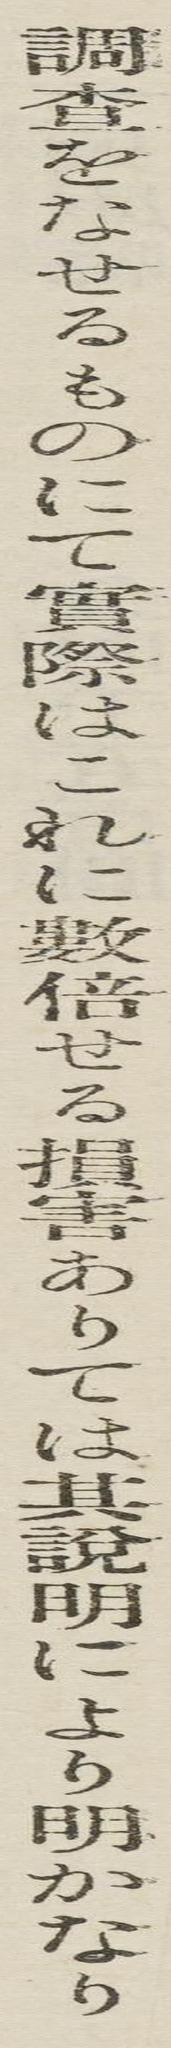調査をなせるものにて実際はこれに数倍せる損害ありては其説明により明かなり
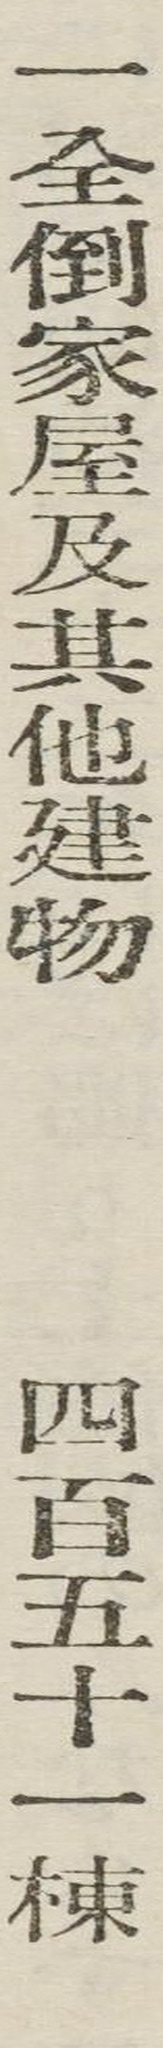一全倒家屋及其他建物四百五十一棟
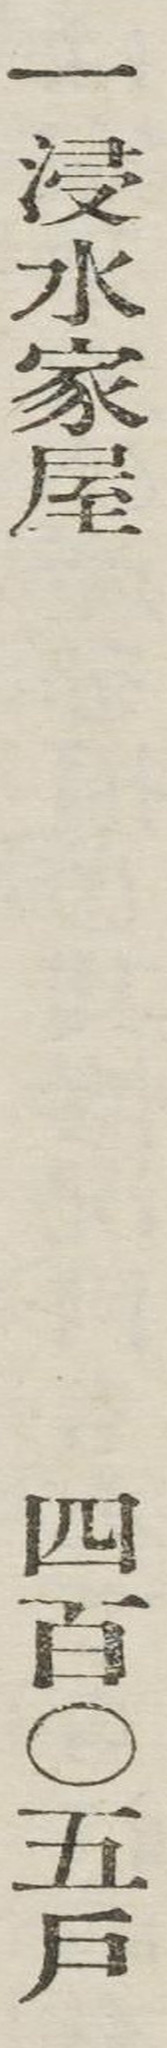一浸水家屋四百〇五戸
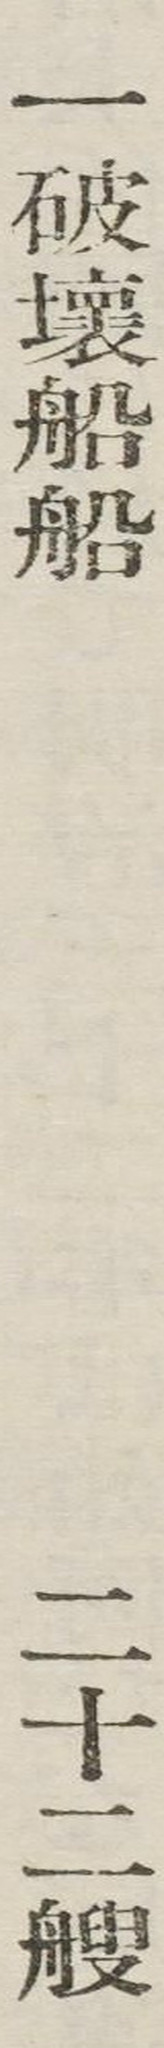一破壊船船二十二艘
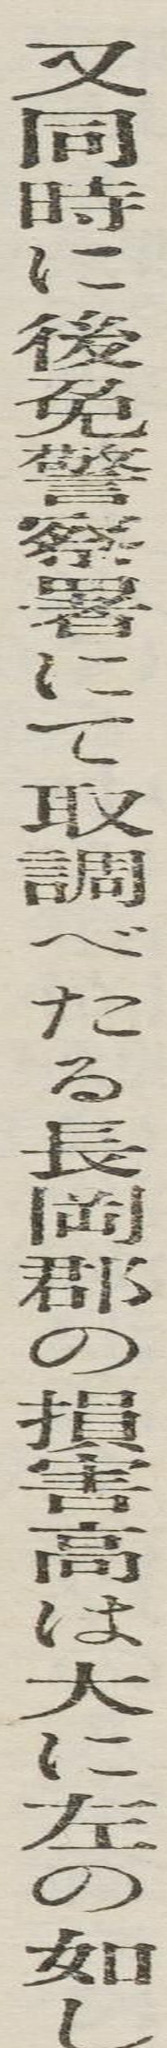又同時に後免警察署にて取調べたる長岡郡の損害高は大に左の如し
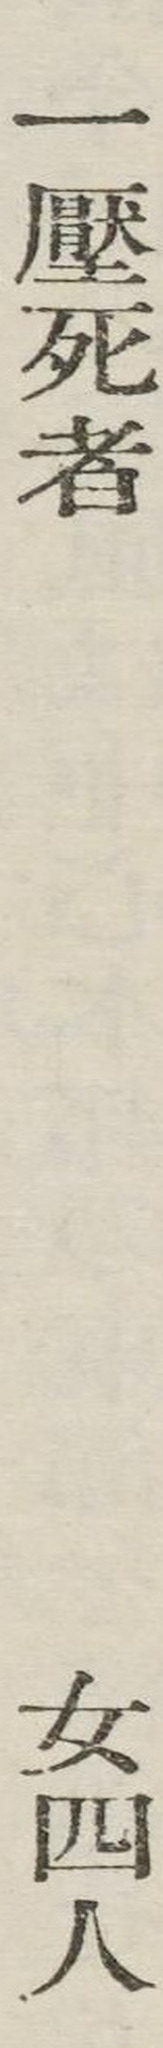一圧死者女四人
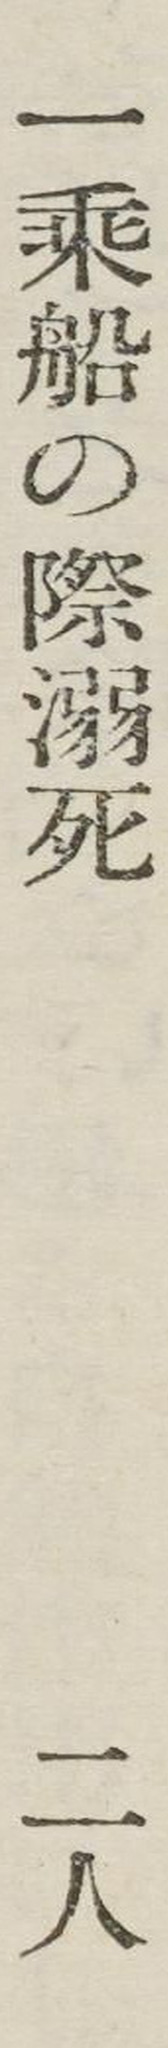一乗船の際溺死二人
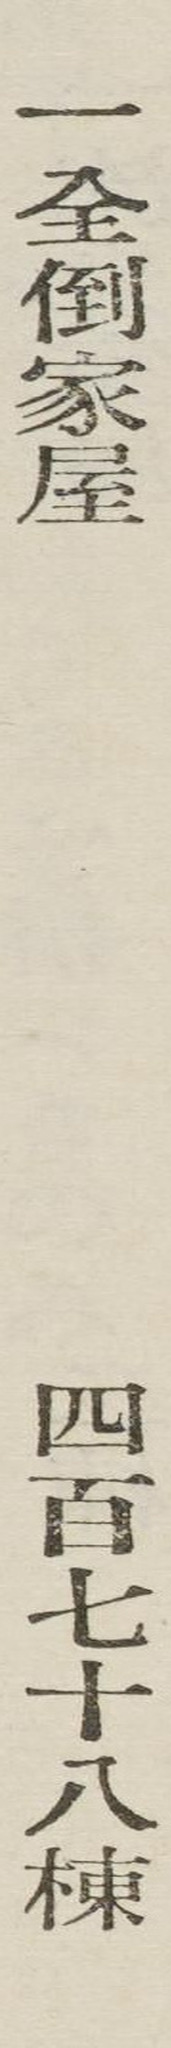一全倒家屋四百七十八棟
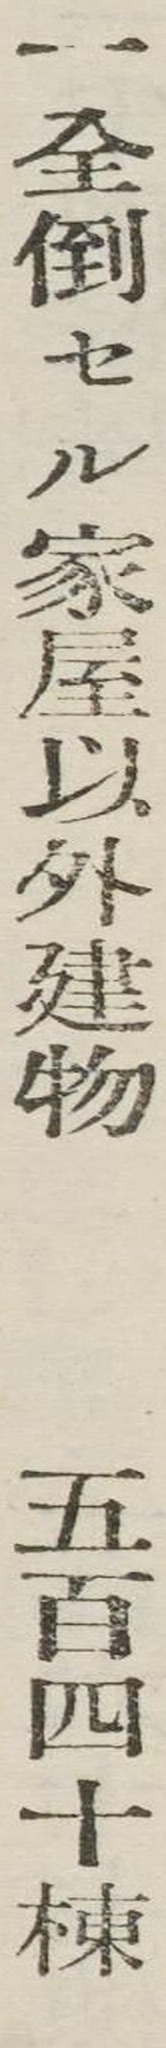一全倒セル家屋以外建物五百四十棟

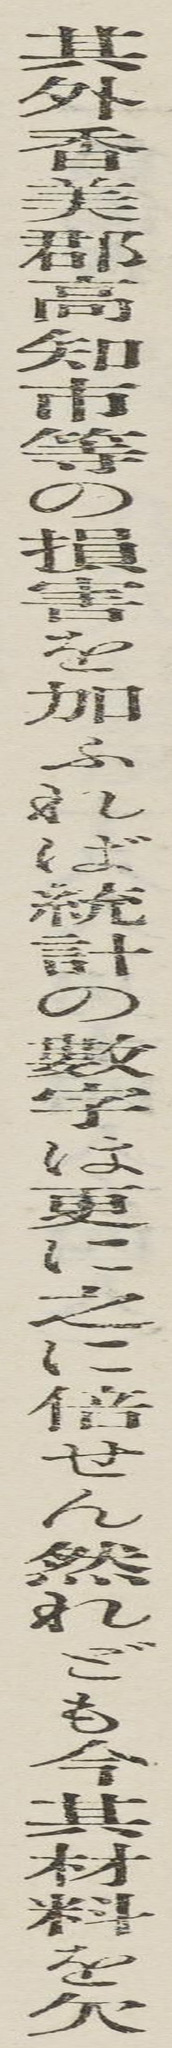其外香美郡高知市等の損害を加ふれば統計の数字は更に之に倍せん然れども今其材料を欠
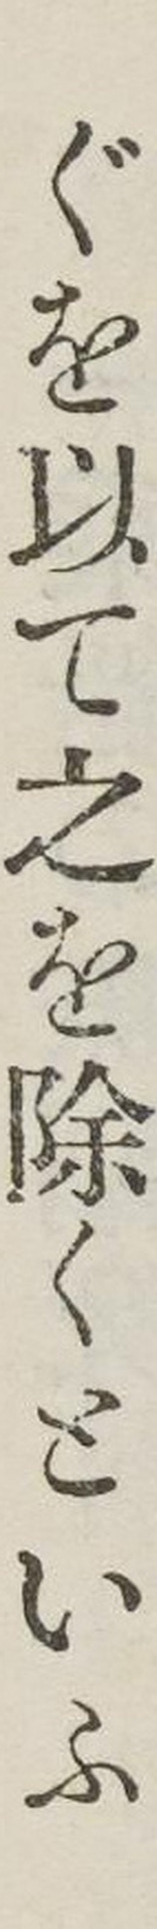ぐを以て之を除くといふ
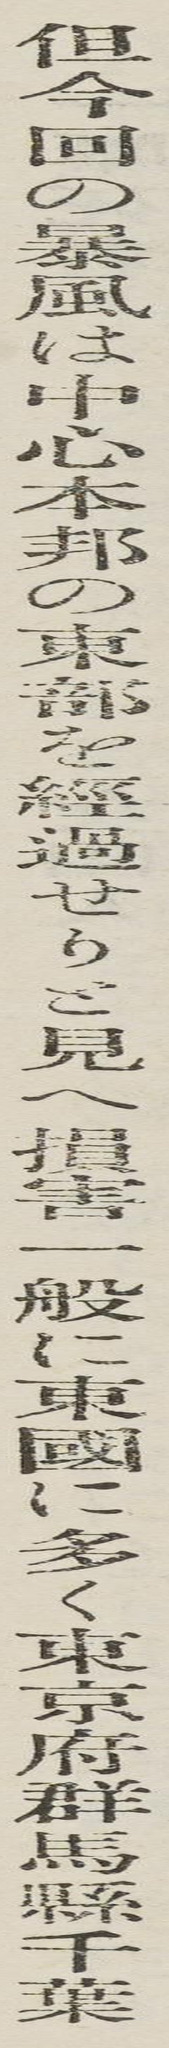但今回の暴風は中心本邦の東部を経過せりと見へ損害一般に東国に多く東京府群馬県千葉
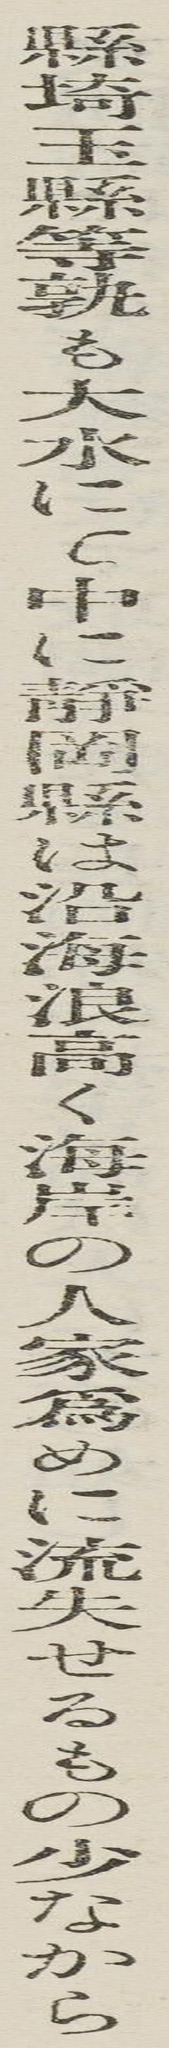県埼玉県等孰も大水にて中に静岡県は沿岸浪高く海岸の人家為めに流失せるもの少なから
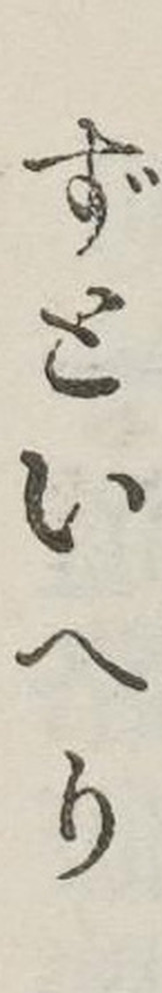ずといへり
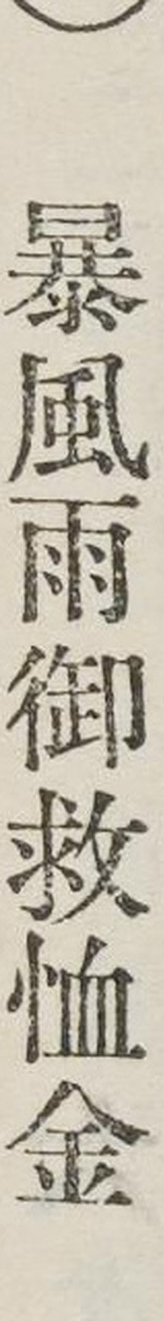暴風雨御救恤金
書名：土佐古今ノ地震
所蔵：東京大学地震研究所図書室 Earthquake Research Institute Library, The University of Tokyo, JAPAN
